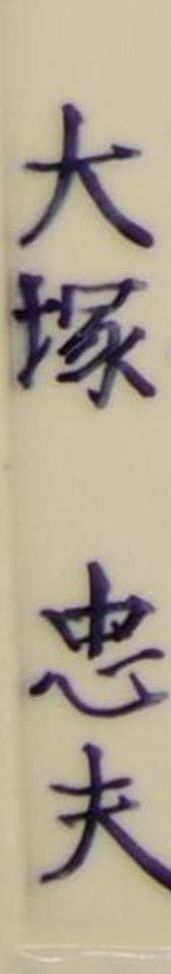大塚忠夫

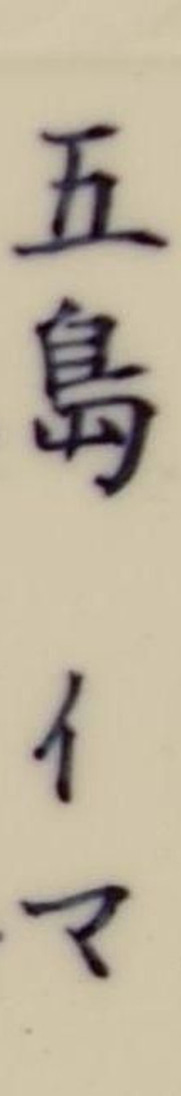五島イマ
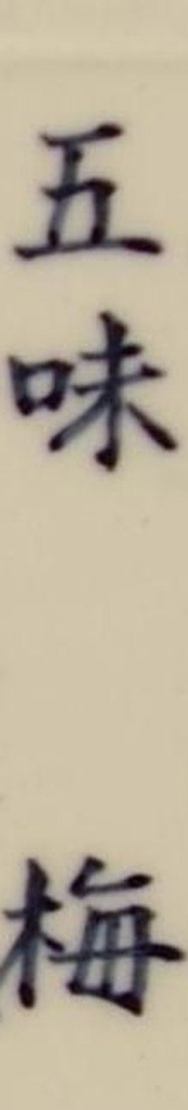五味梅
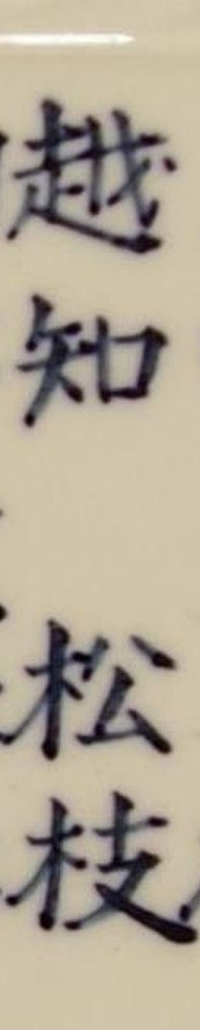越知松枝
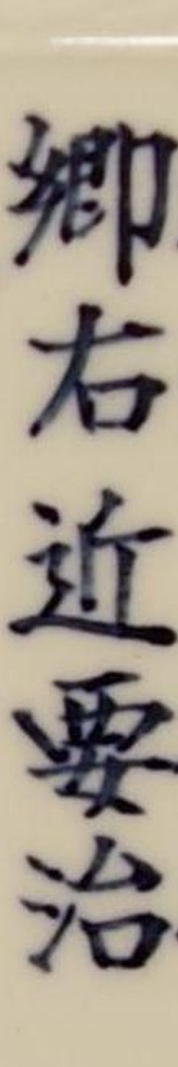郷右近要治
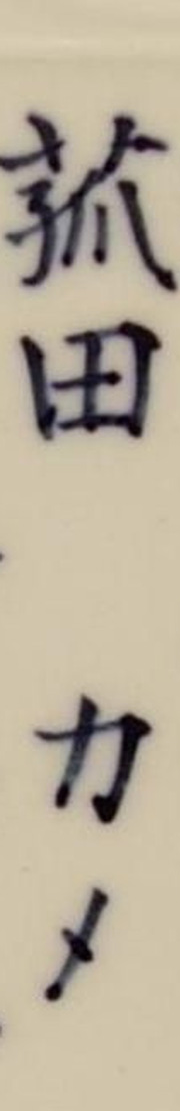菰田カメ
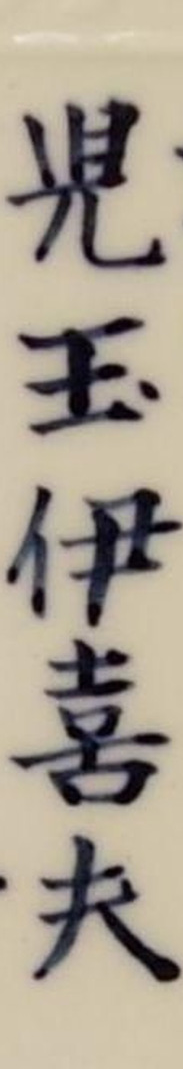見玉伊喜夫
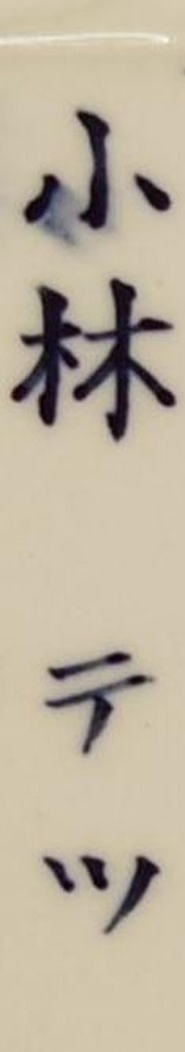小林テツ

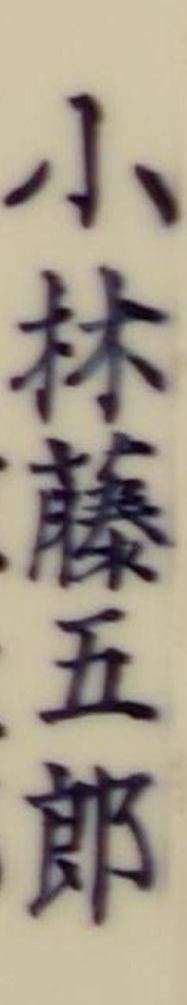小林藤五郎
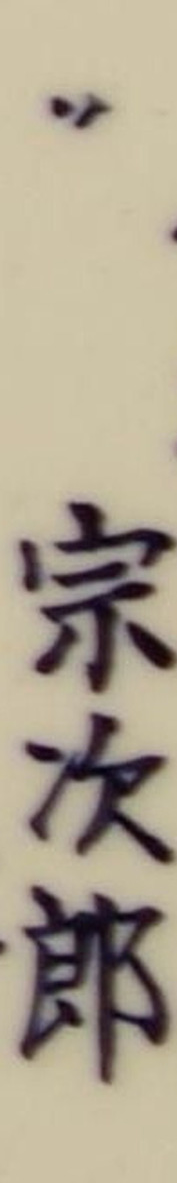宗次郎
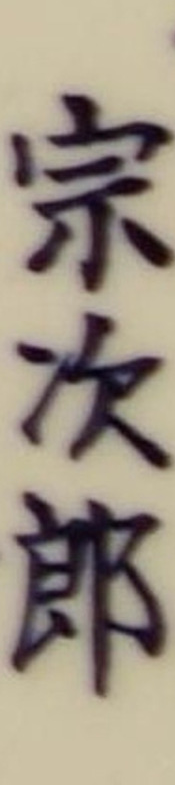宗次郎
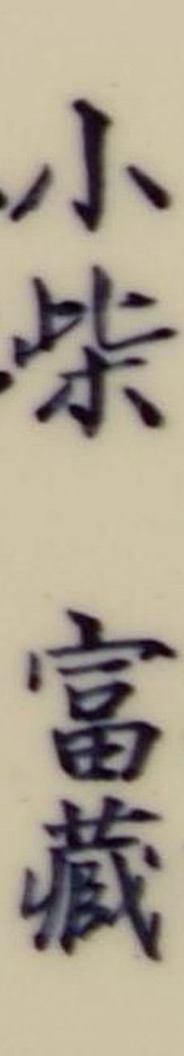小柴富蔵
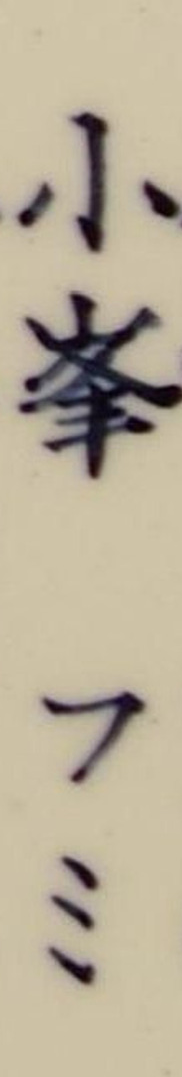小峯フミ
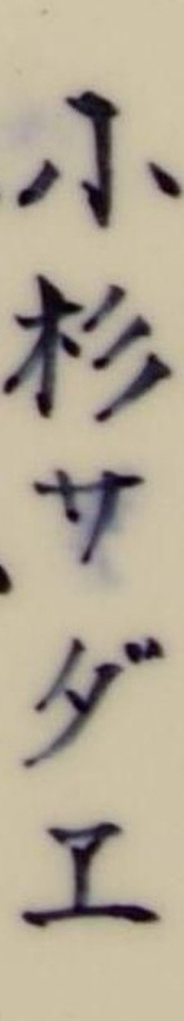小杉サダエ
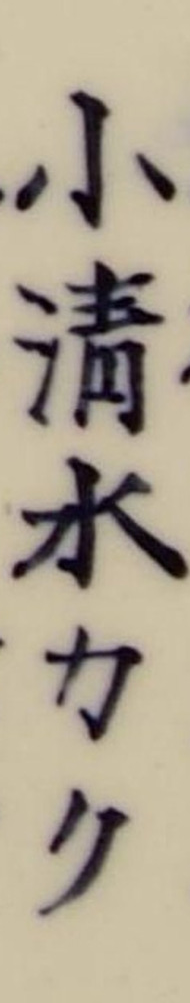小清水カク
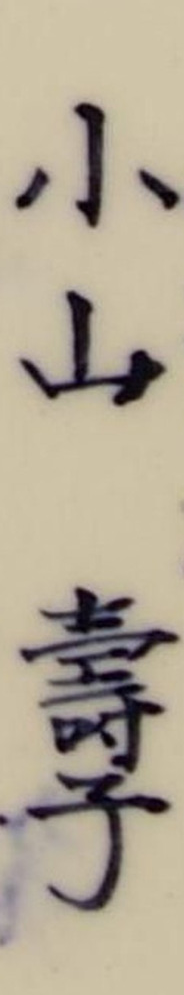小山壽子
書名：E~L
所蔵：高野山金剛峯寺
